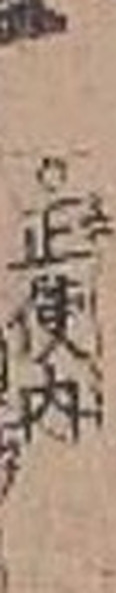○正使内
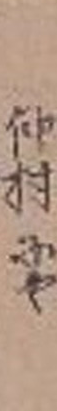仲村にや
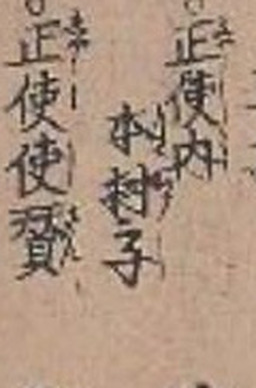本村子
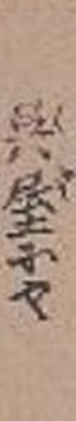呉屋にや
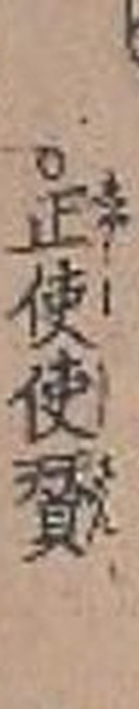○正使使賛
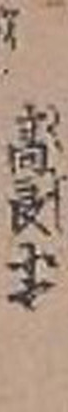高良にや
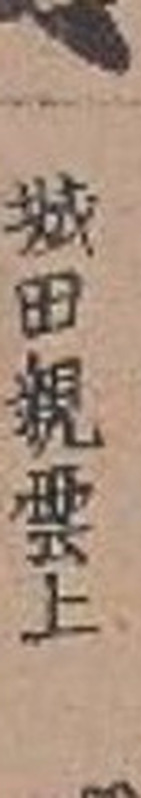城田親雲上
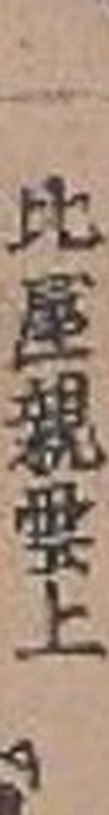比屋親雲上
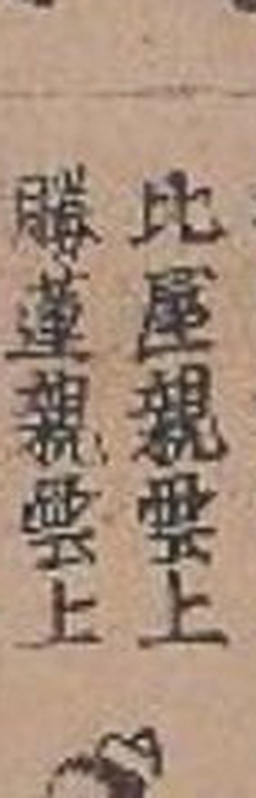勝蓮親雲上
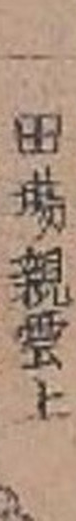田場親雲上
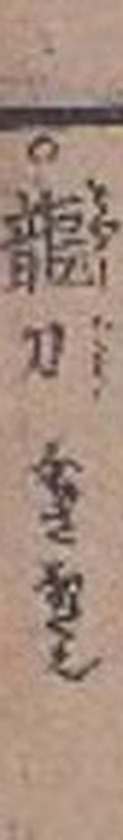○龍刀なぎなた也
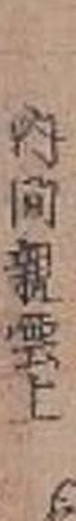内間親雲上
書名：琉球人行列附 天保十三壬寅年十一月
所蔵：University of the Ryukyus Library
